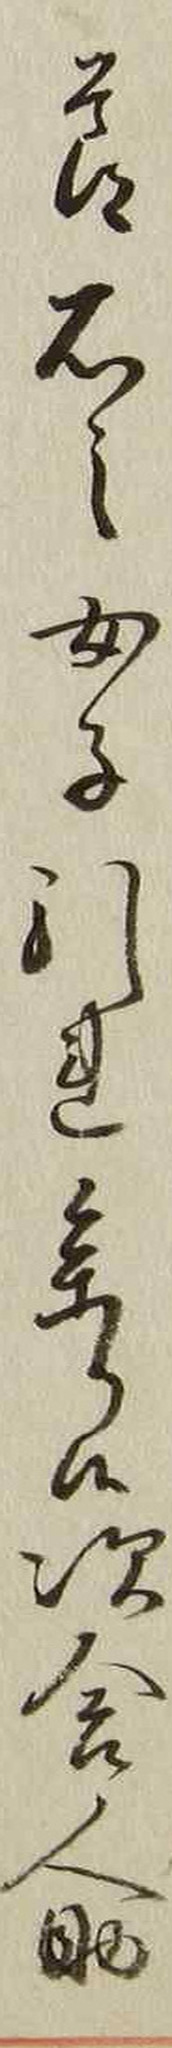節右之女子引連参候次舎人助
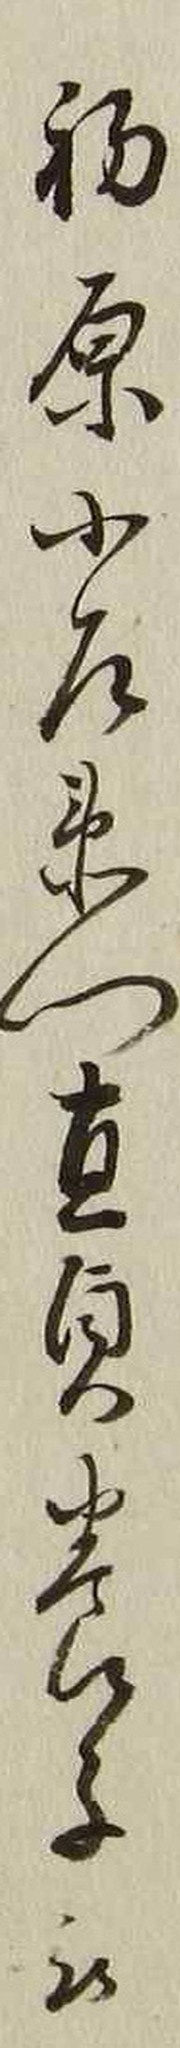初原小左衛門直貞養子被
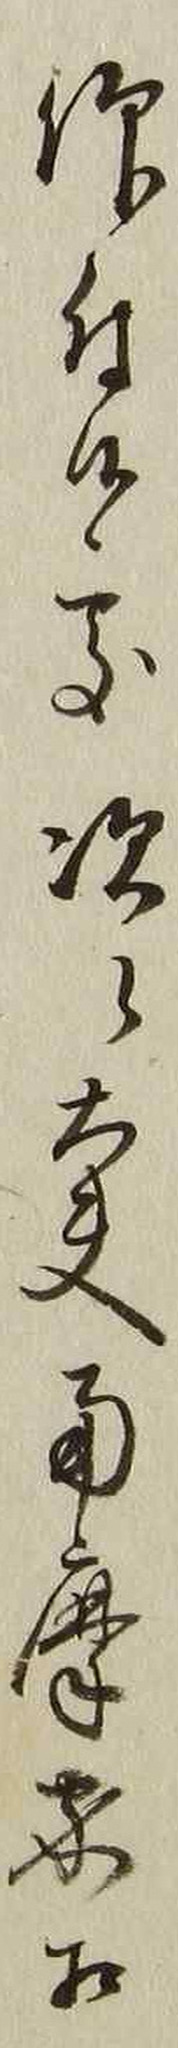仰付候処次郎太夫南摩家相
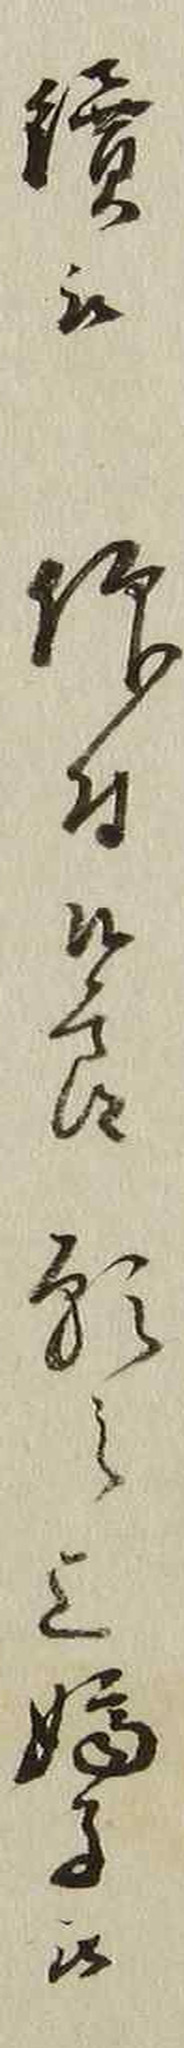続被仰付候節之上嫡子被
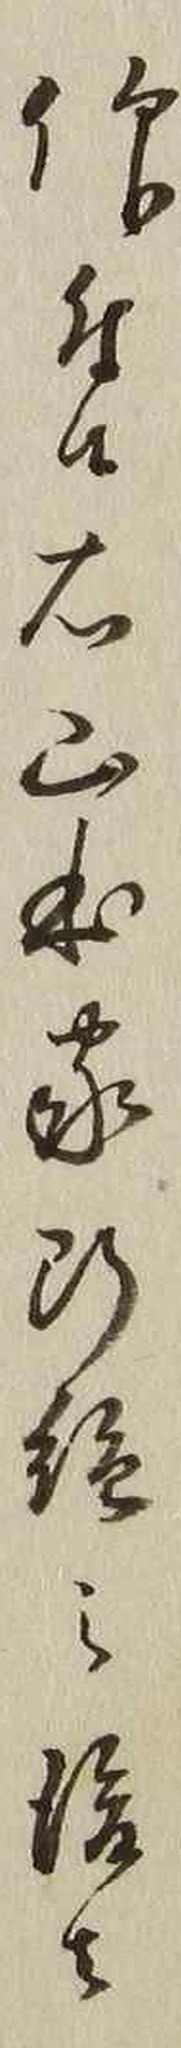仰付候右山本家断絶之後は
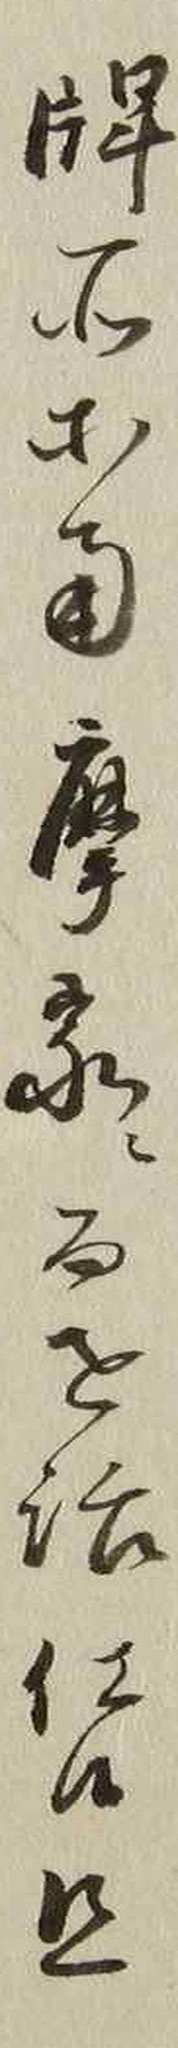牌所等南摩家に而世話仕候旦
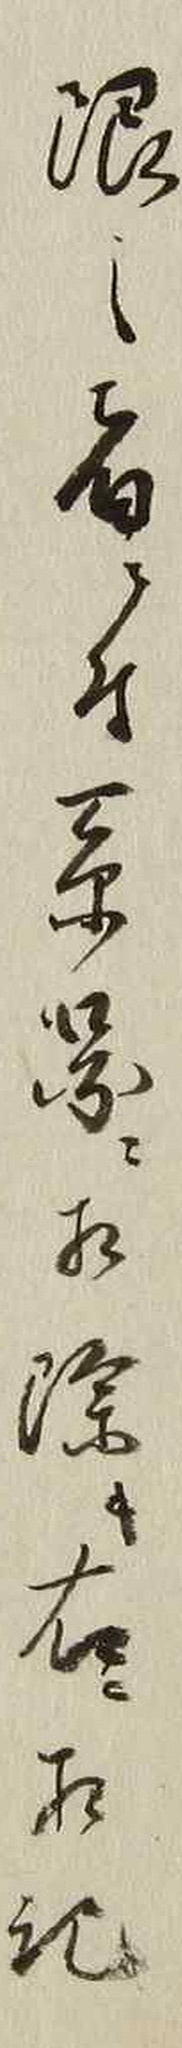限之者に付系図に相除き右に相記
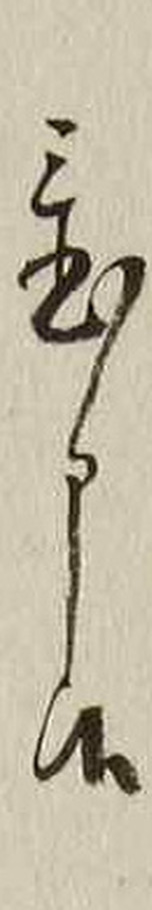置申候
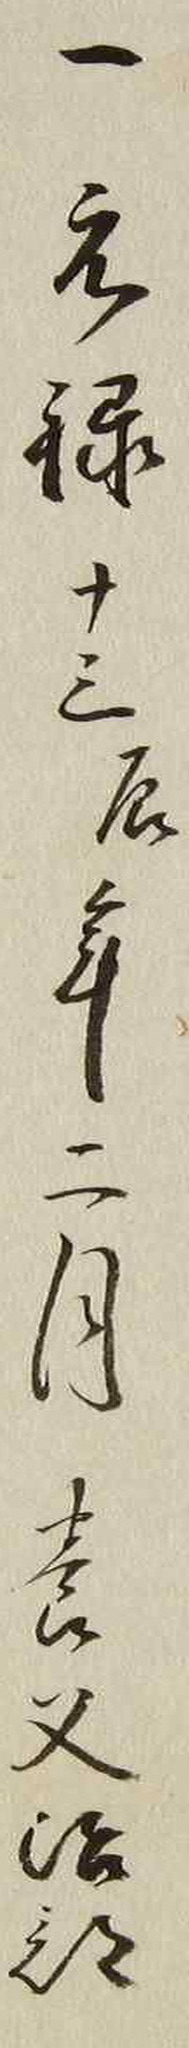一元禄十三辰年二月養又治部
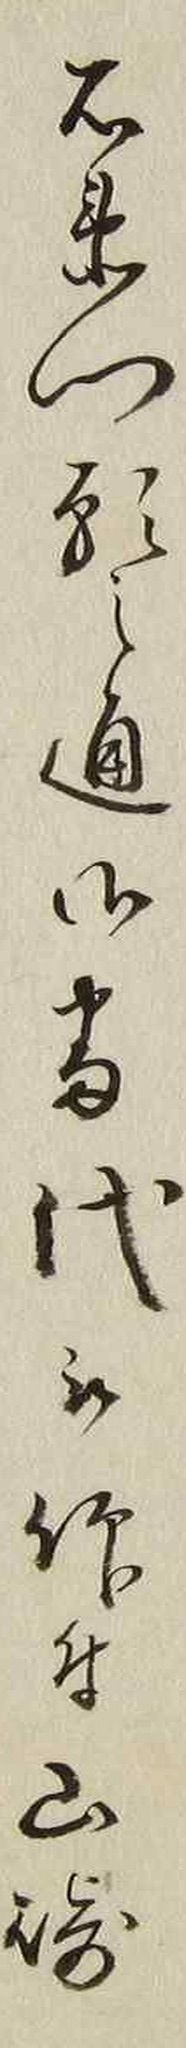右衛門願之通御番代被仰付山崎
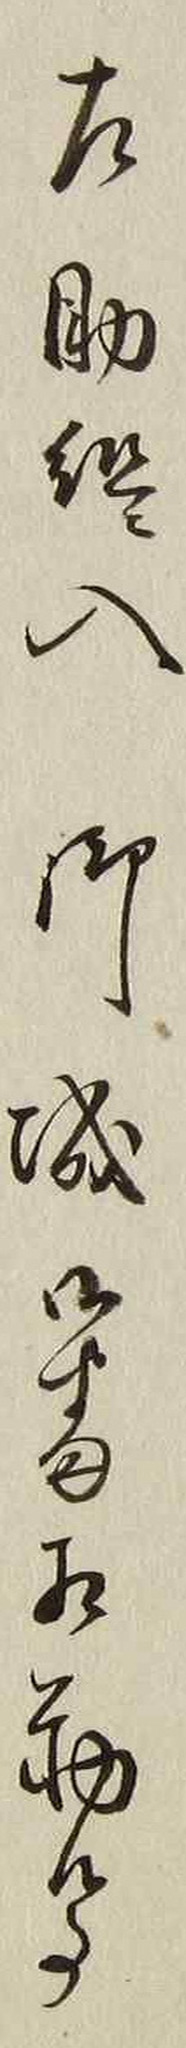左助組に入御城御番相勤候事
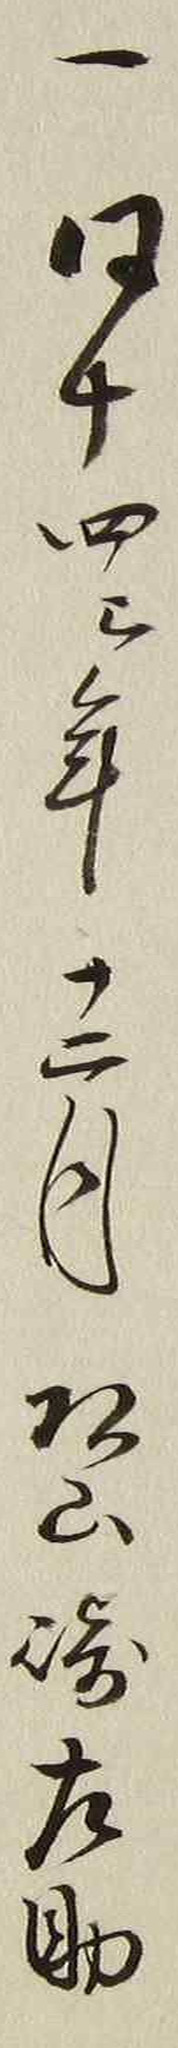一同十四巳年十二月頭山崎左助
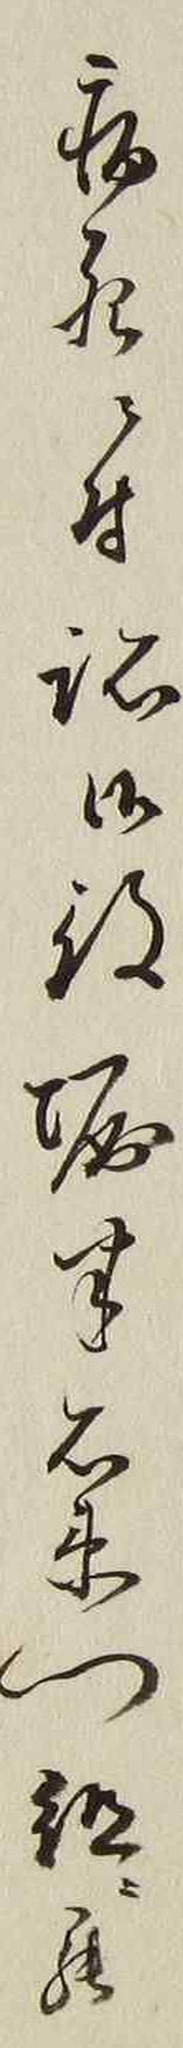病死に付跡御役堀半右衛門組に罷
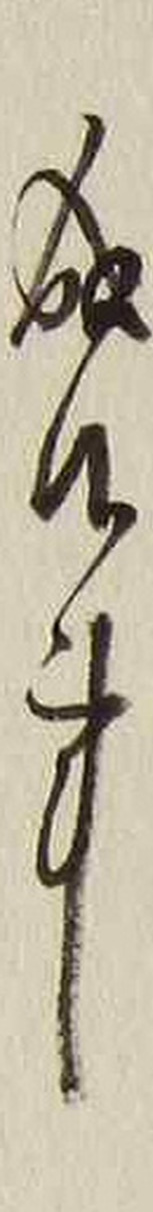成候事
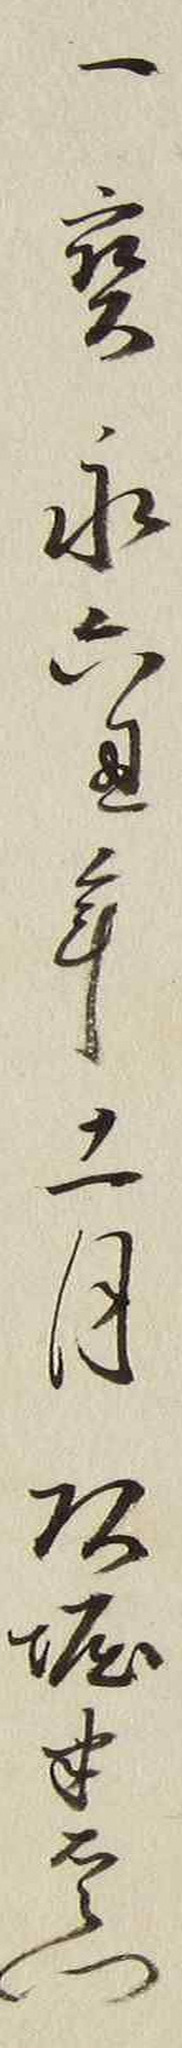一宝永六丑十一月頭堀半右衛門
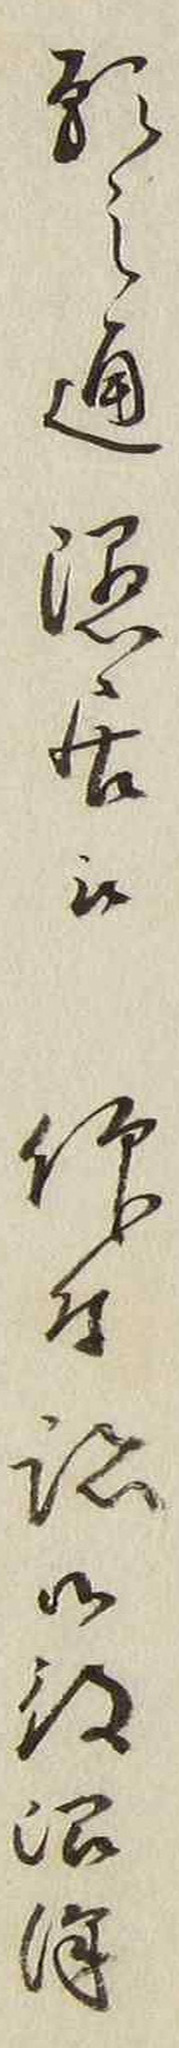願之通隠居被仰付跡御役沼澤
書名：諸士系譜　巻之159　な之部1
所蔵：会津若松市立会津図書館
